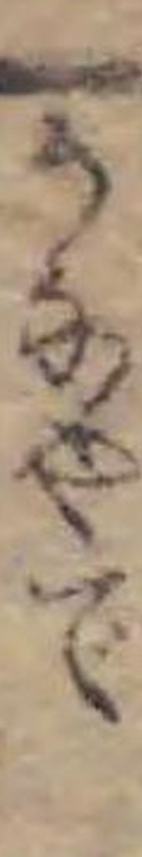かなやで
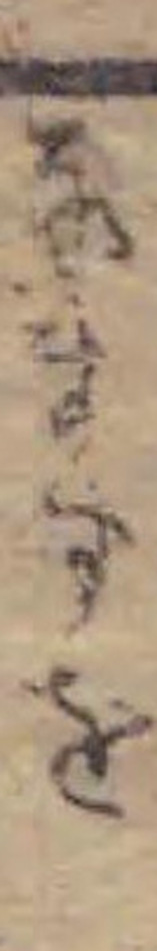なますを
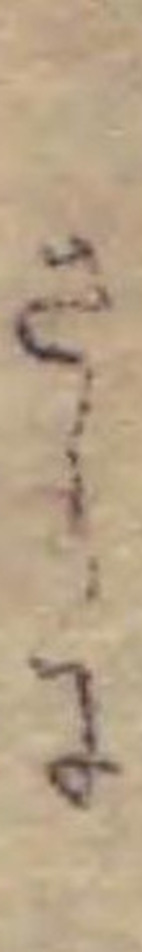さらに
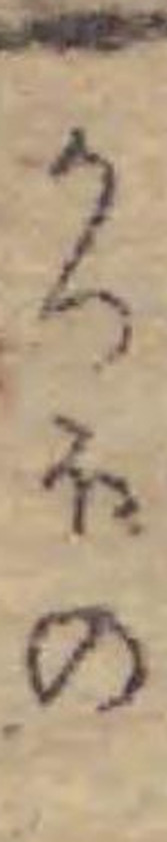かつほの
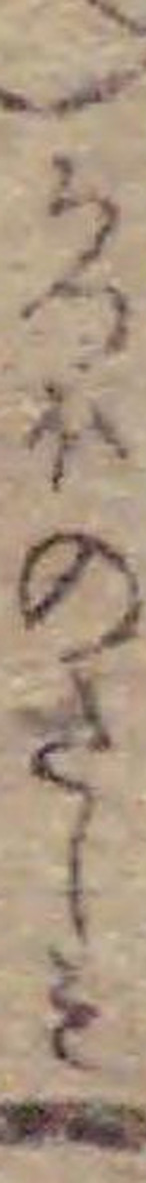かつほのさしみ
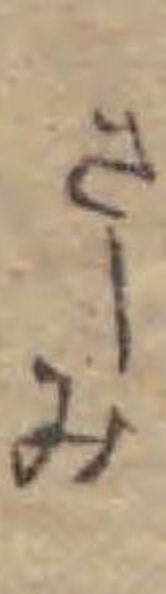さしみ
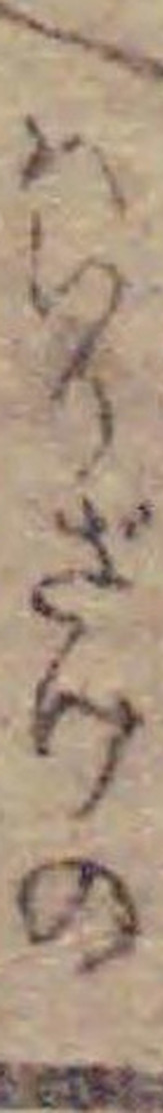はいりざけの
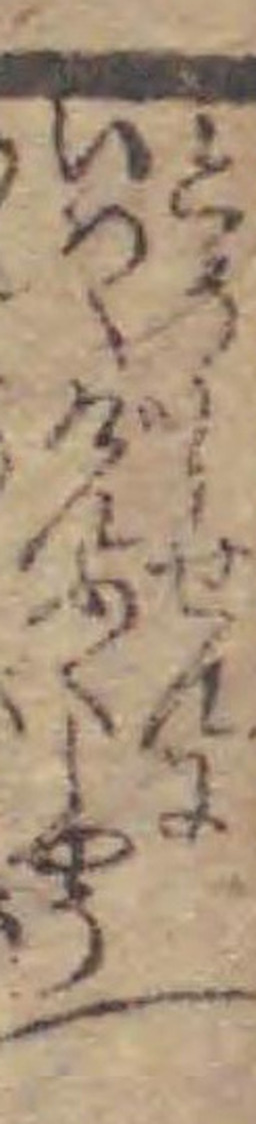いはくげんぶくしやう
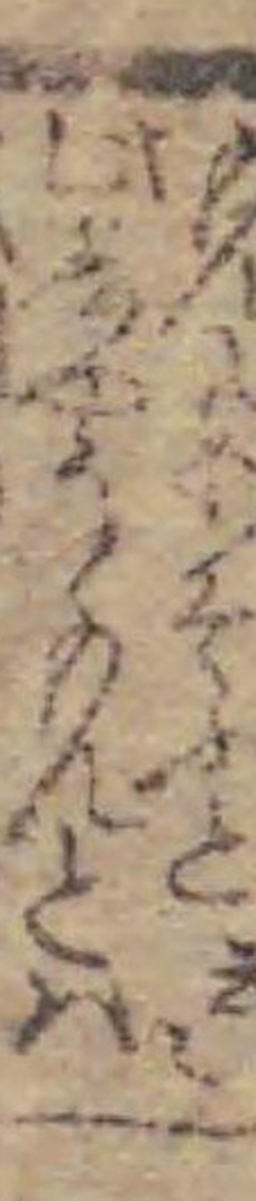此しやうもんとは
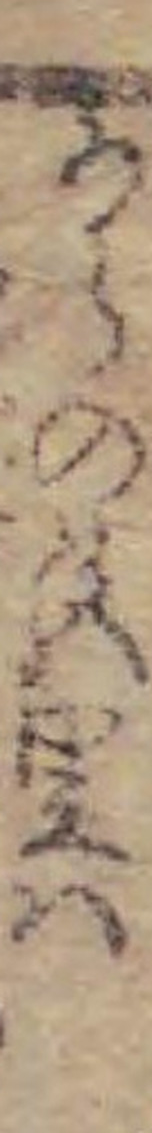からの色里は
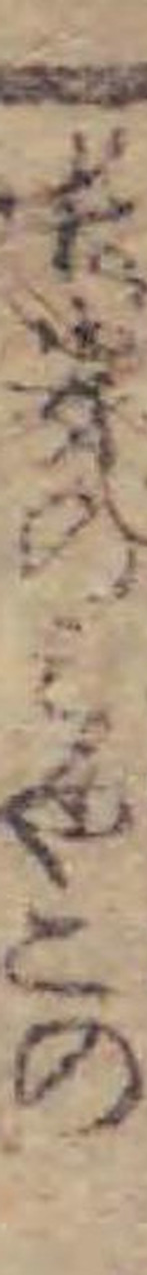長安のみやこの
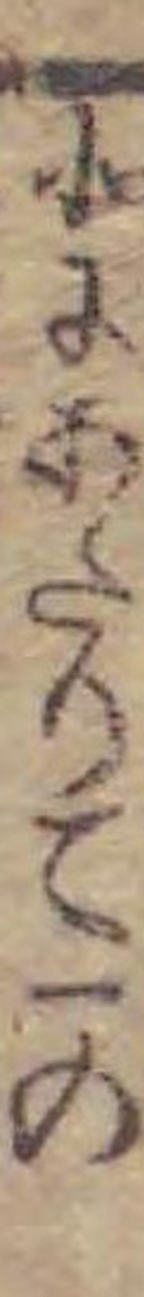北にあたりて一の
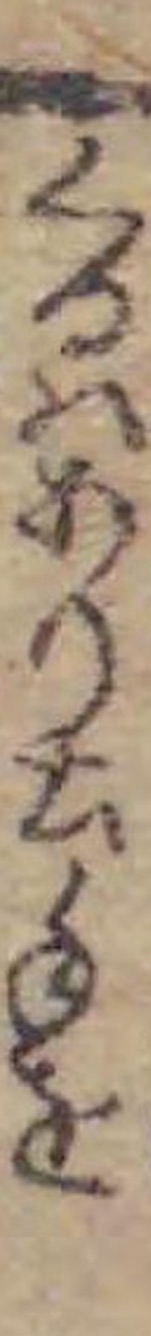くるはあり土手を
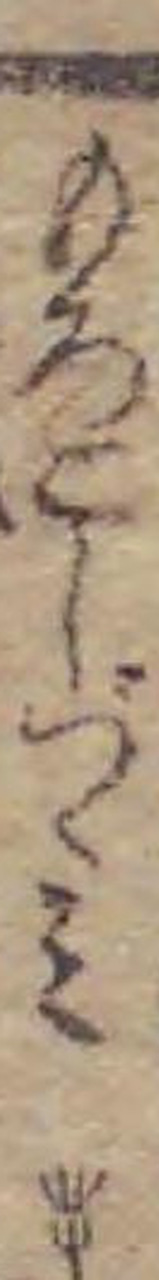もろこしづゝみ
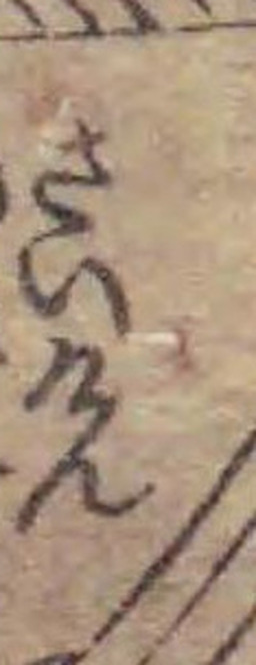さいけん
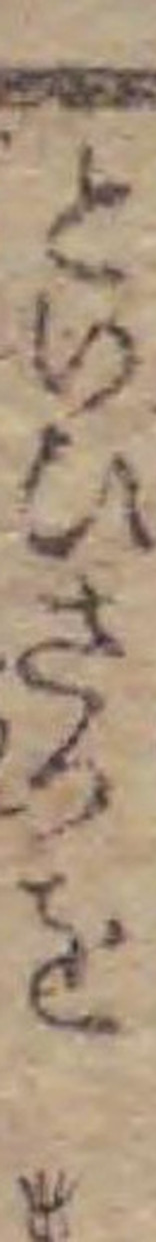といひさかを
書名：此奴和日本 : 2巻
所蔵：国立国会図書館 National Diet Library, JAPAN
